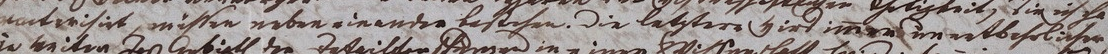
racterisirt, müssen neben einander bestehen. Die letztere wird immer unentbehrlicher,
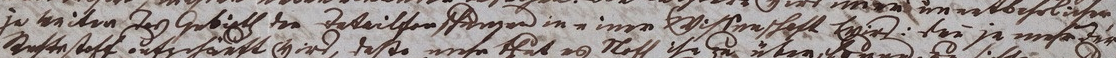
je weiter das Gebieth der Detailforschungen in einer Wissenschaft wird: denn je mehr der
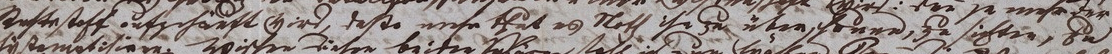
Rechtsstoff aufgehäuft wird, desto mehr thut es Noth ihn zu überschauen, zu sichten, zu
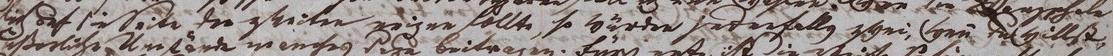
sich auf die Seite der zweiten neigen sollte, so würden jedenfalls zwei, wenn Du willst,
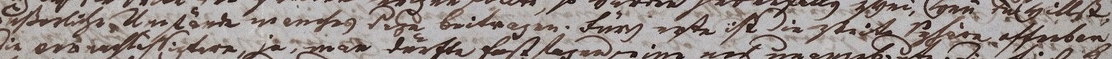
äußerliche Umstände manches dazu beitragen. Fürs erste ist die zweite Sphäre offenbar
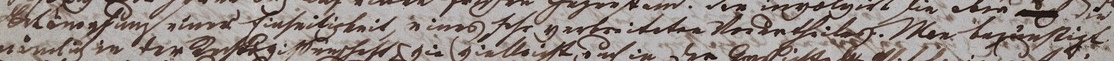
Bekämpfung einer Einseitigkeit, eines sehr verbreiteten Vorurtheiles. Man begünstigt
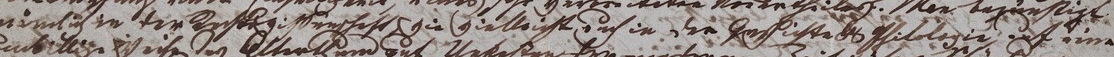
nämlich in der Rechtswissenschaft, wie vielleicht auch in der Geschichte & Philologie, auf eine
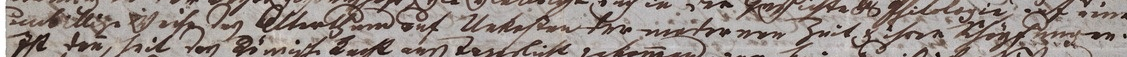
unbillige Weise das Alterthum auf Unkosten der modernen Zeit & ihrer Schöpfungen.
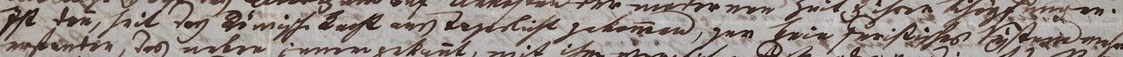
Ist denn, seit das Römische Recht ans Tageslicht gekommen, gar kein juristisches System mehr
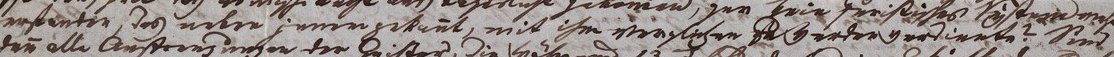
erstanden, das neben jenem gekannt, mit ihm verglichen zu werden verdiente? Sind
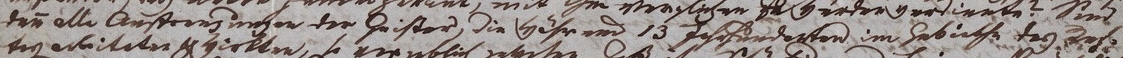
denn alle Anstrengungen der Geister, die während 13 Jahrhunderten im Gebiethe des Rech-
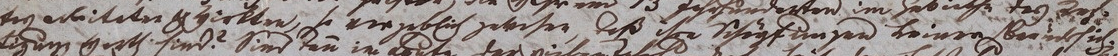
tes arbeiteten & wirkten, so vergeblich gewesen, daß ihre Schöpfungen keiner Berücksich-
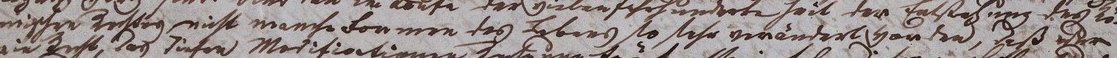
mischen Rechtes nicht manche Formen des Lebens so sehr verändert worden, daß nur
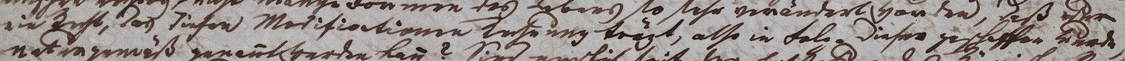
ein Recht, das diesen Modificationen Rechnung trägt, also in Folge dieser geschaffen wurde,
